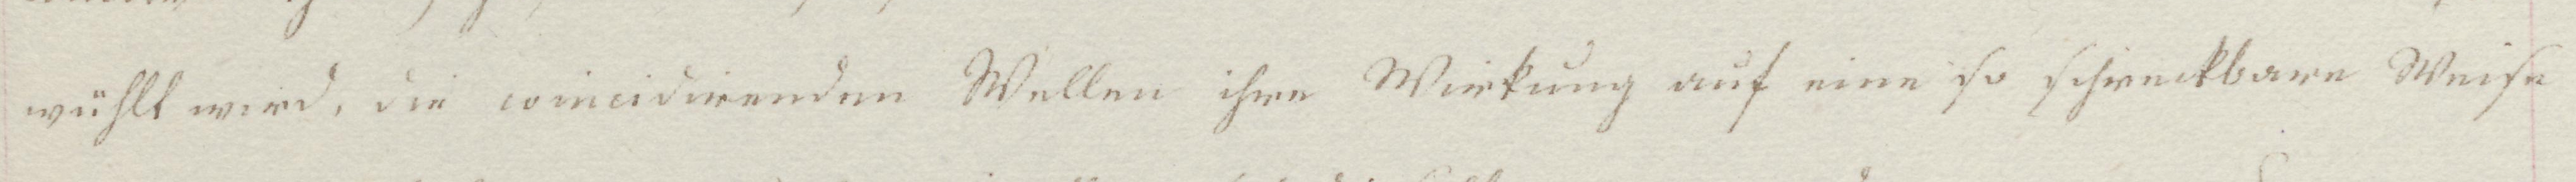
wühlt wird, die coincidirenden Wellen ihre Wirkung auf eine so schreckbare Weise
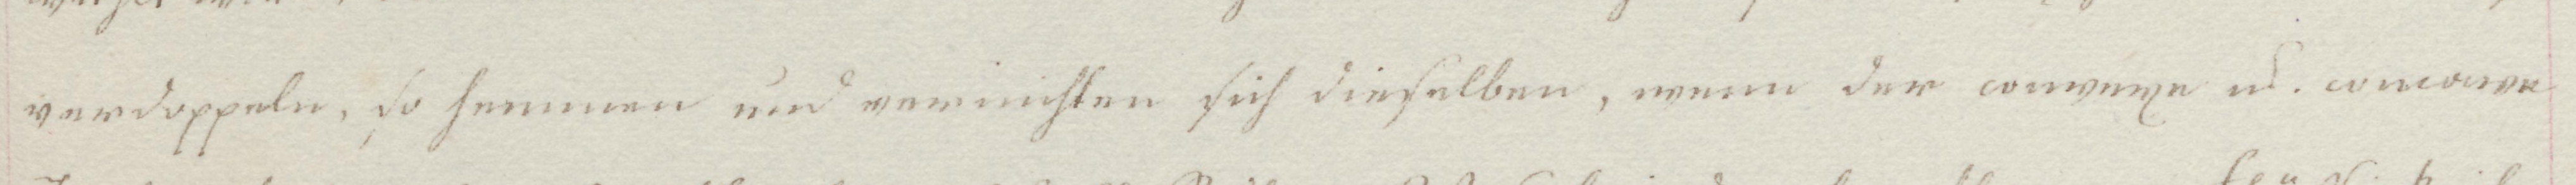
verdoppeln, so hemmen und vernichten sich dieselben, wenn der convexe u. concave
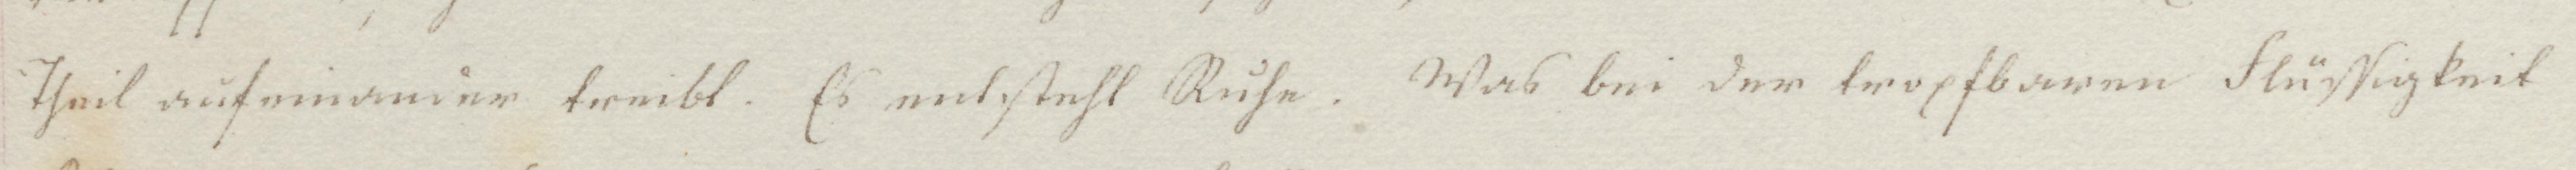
Theil aufeinander treibt. Es entsteht Ruhe. Was bei der tropfbaren Flüssigkeit
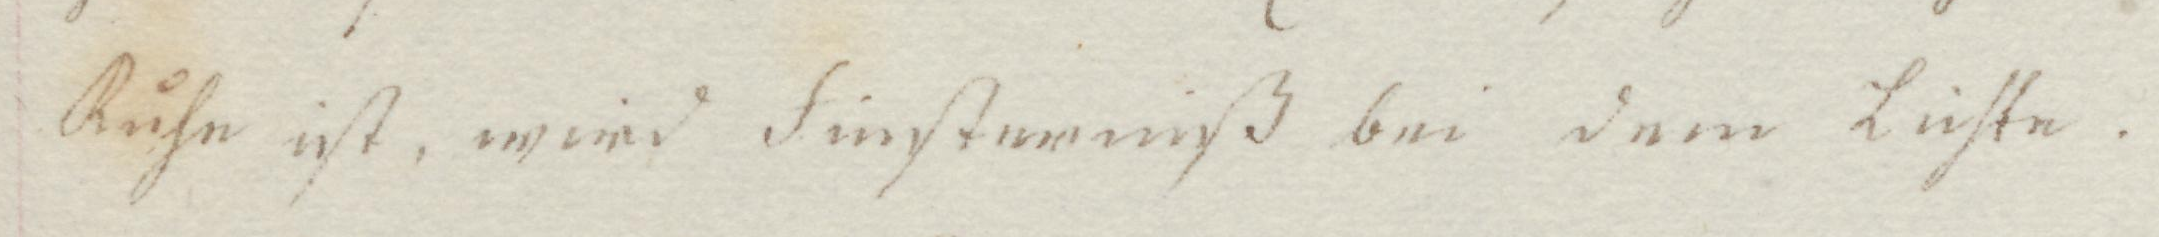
Ruhe ist, wird Finsterniß bei dem Lichte.
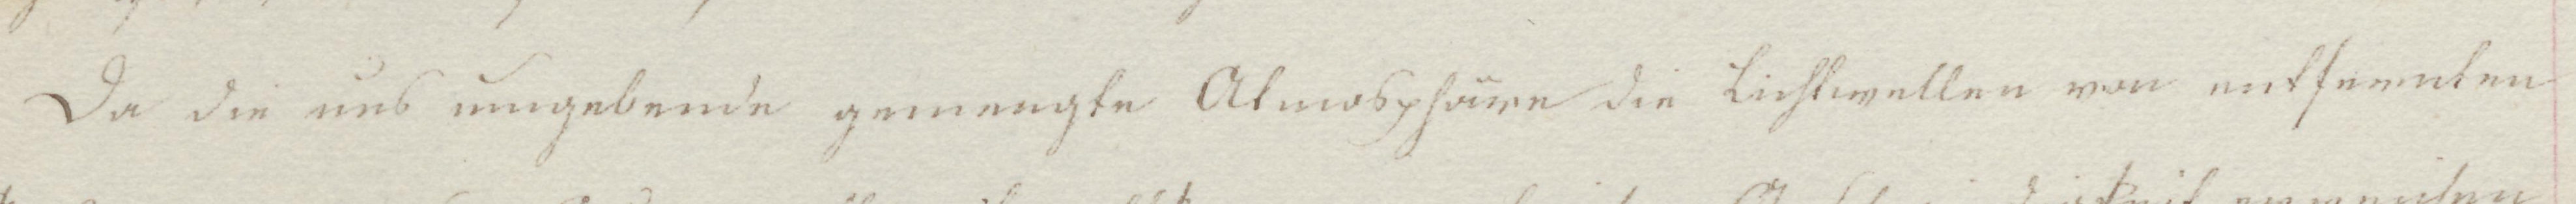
Da die uns umgebende gemengte Atmosphäre die Lichtwellen von entfernten
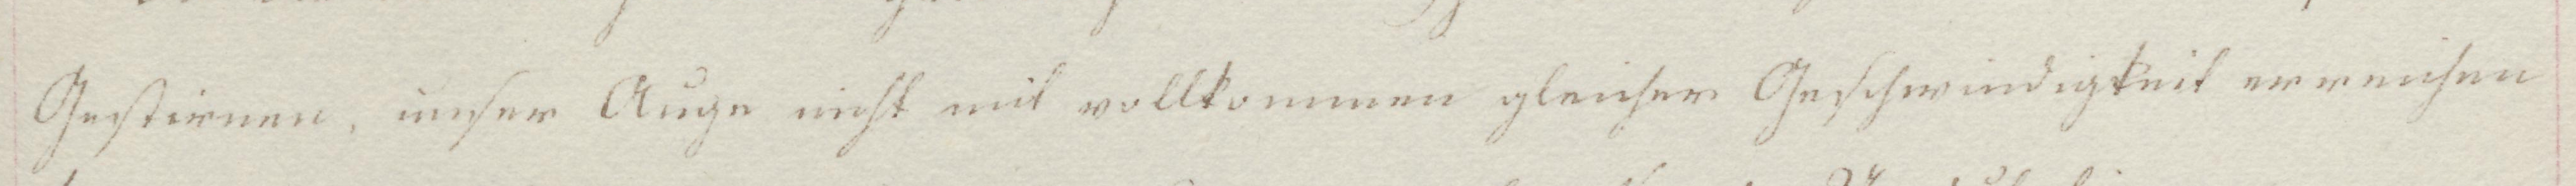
Gestirnen, unser Auge nicht mit vollkommen gleicher Geschwindigkeit erreichen
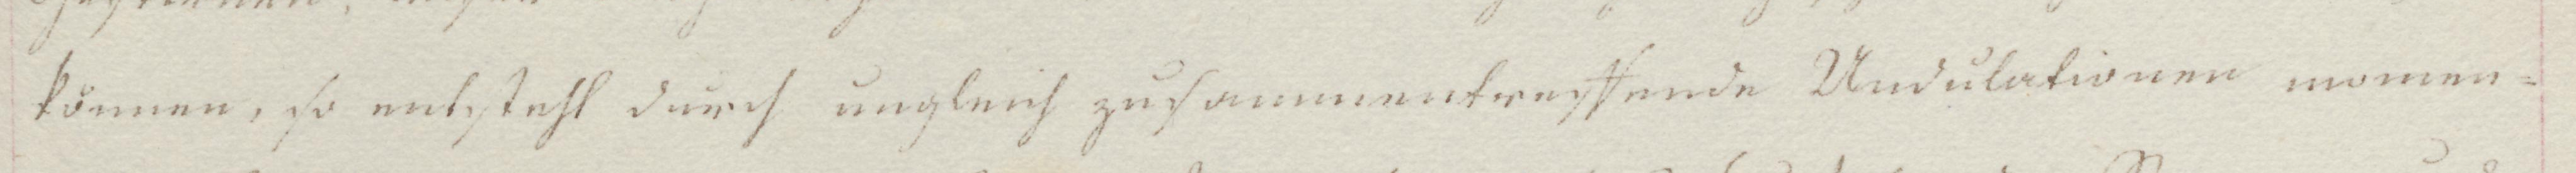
können, so entsteht durch ungleich zusammentreffende Undulationen momen-
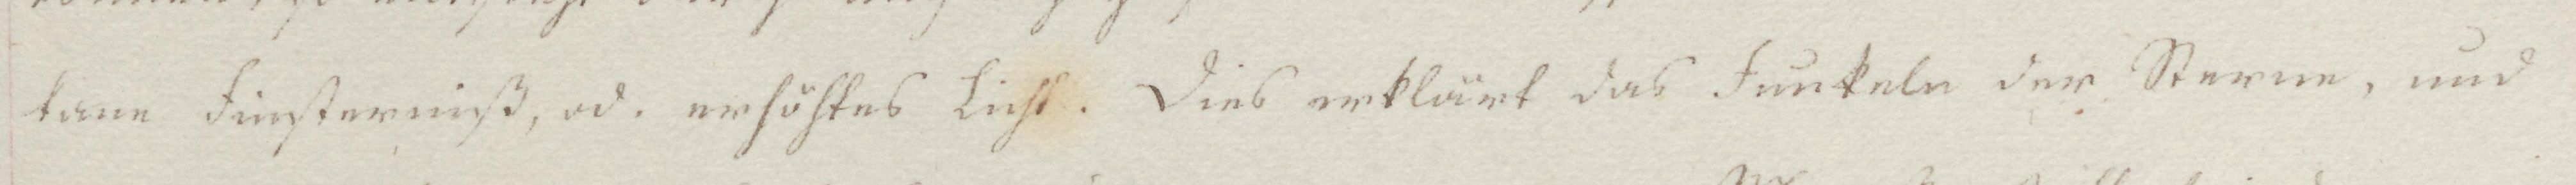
tane Finsterniß, od. erhöhtes Licht. Dies erklärt das Funkeln der Sterne, und
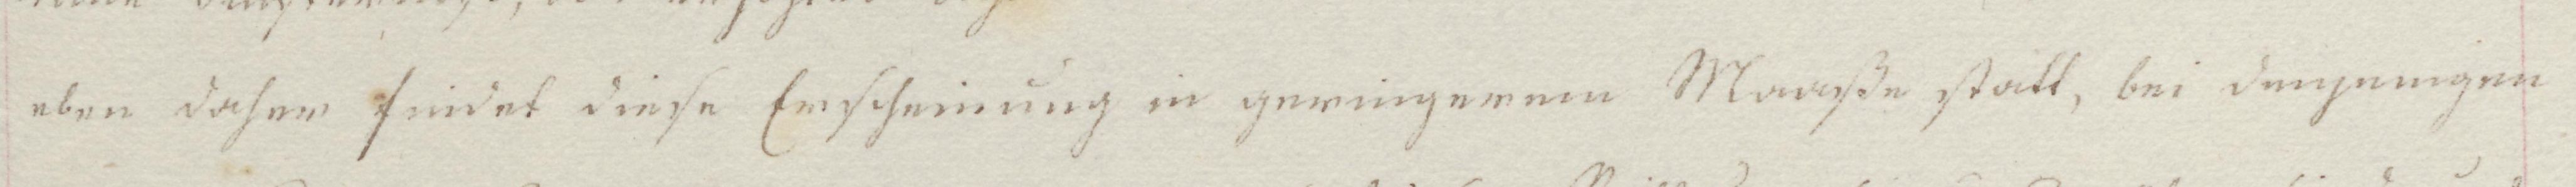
eben daher findet diese Erscheinung in geringerem Maaße statt, bei denjenigen
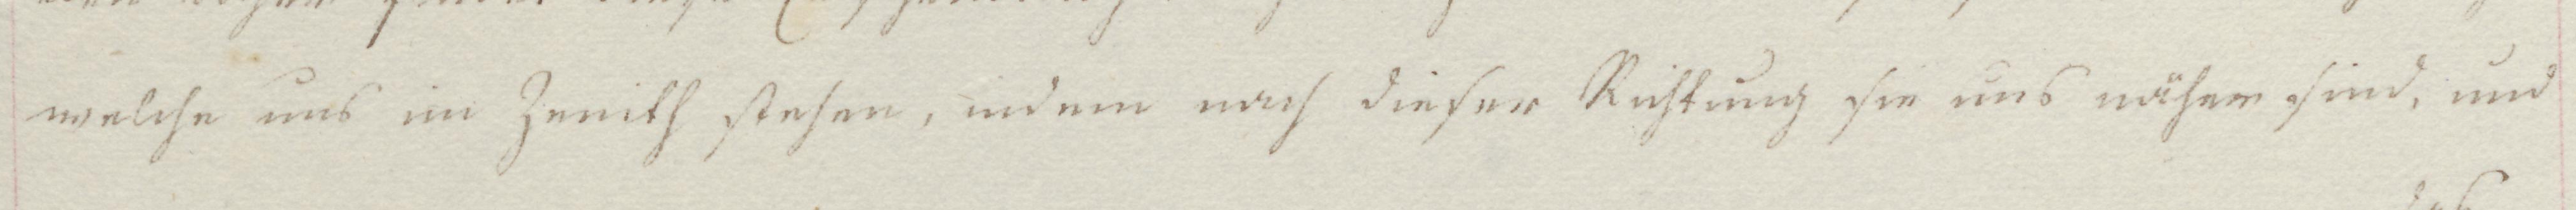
welche uns im Zenith stehen, indem nach dieser Richtung sie uns näher sind, und
